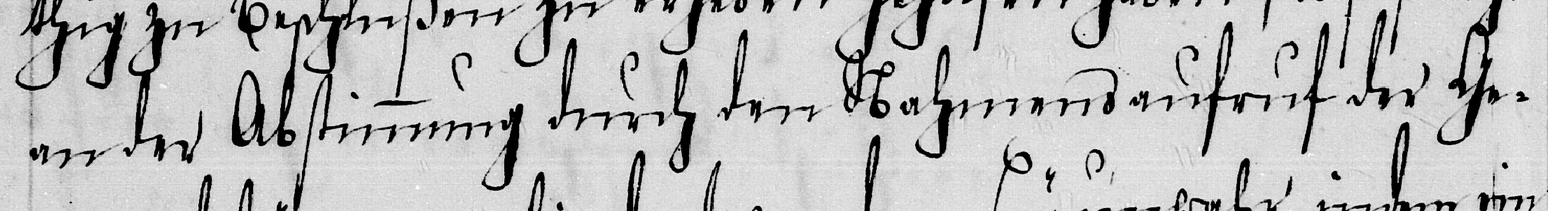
an der Abstimmung durch den Nahmensaufruf der Ge¬
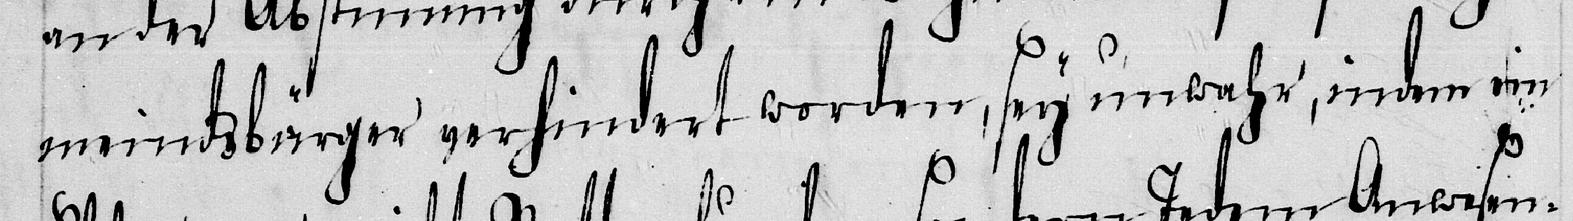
meindsbürger verhindert worden, sey unwahr, indem ein
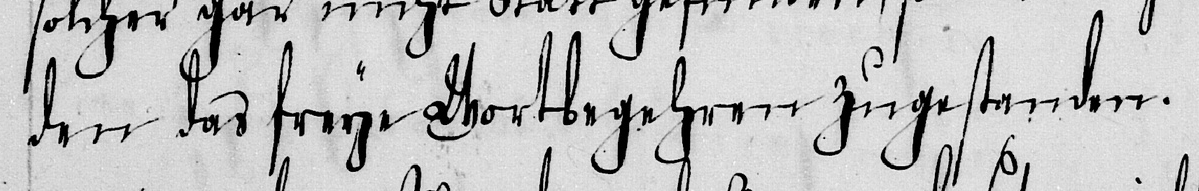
den das freye Wortbegehren zugestanden.
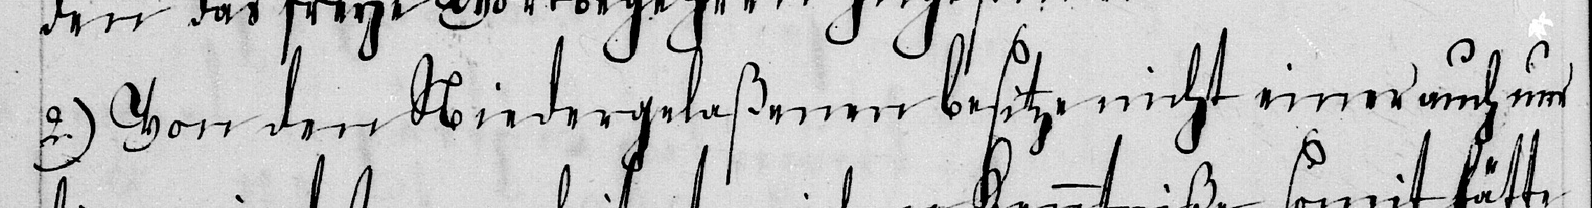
2.) Von den Niedergelaßenen besitze nicht einer auch nur
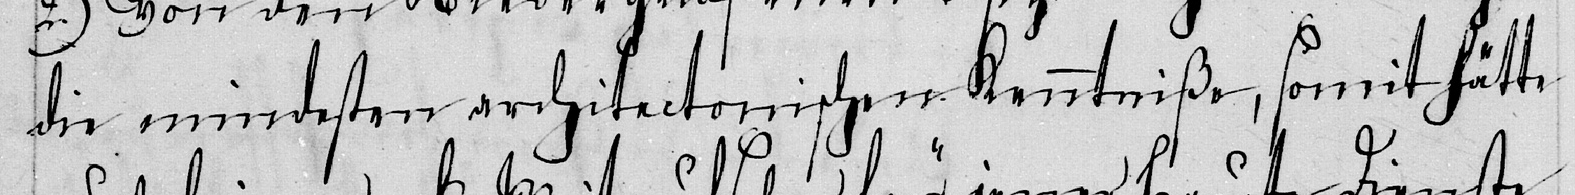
die mindeste architectonischen Kenntniße, somit hätte
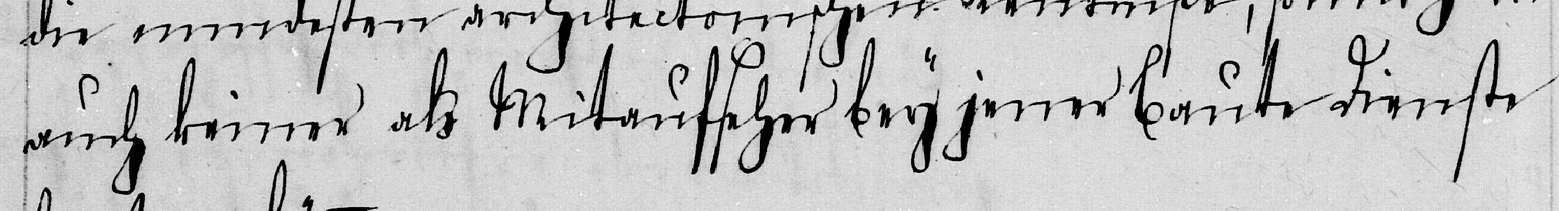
auch keiner als Mitaufseher bey jener Baute Dienste
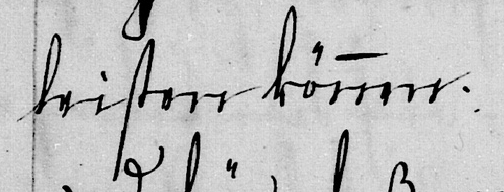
leisten können.
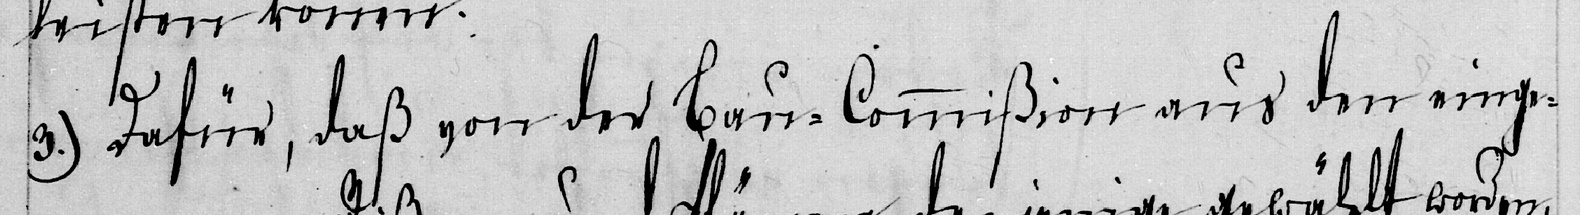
3.) Dafür, daß von der Bau-Commißion aus den einge¬
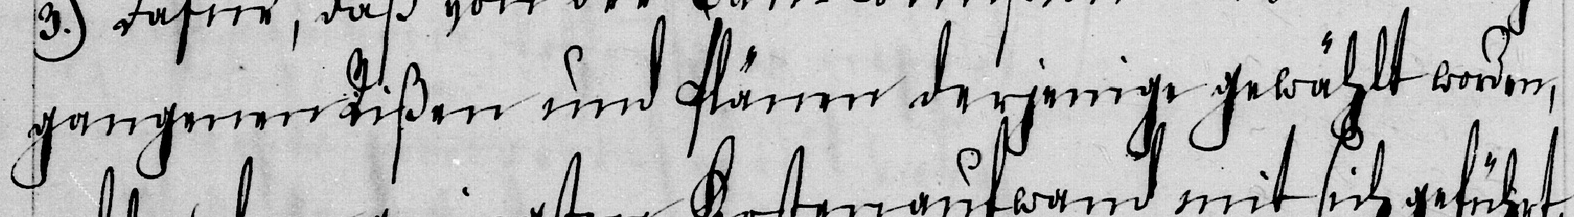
gangenen Rißen und Plänen derjenige gewählt worden,
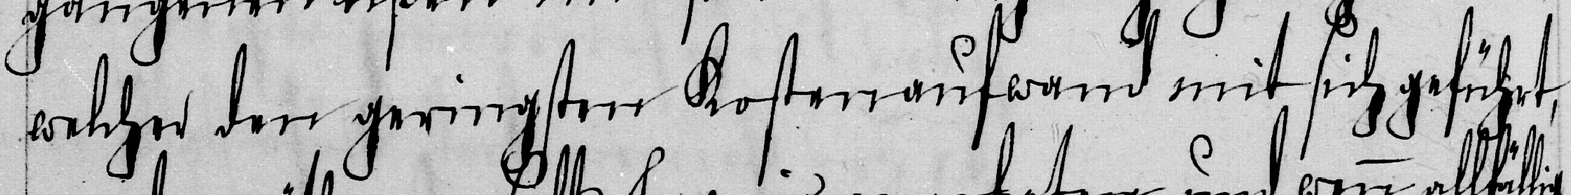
welcher den geringsten Kostenaufwand mit sich geführt,
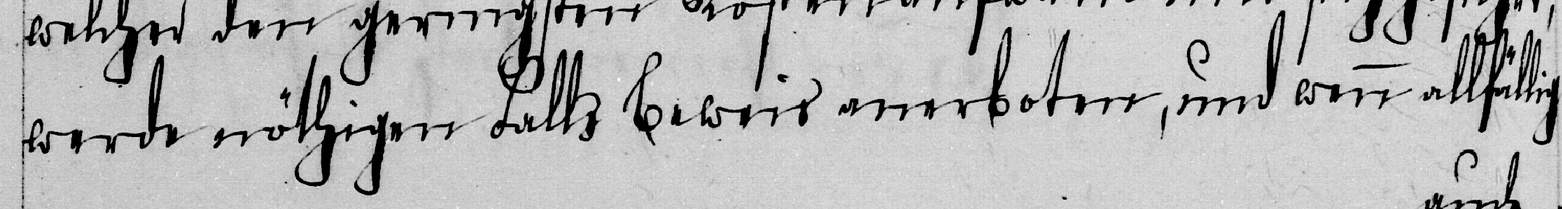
werde nöthigen Falls Beweis anerboten, und wenn allfäl¬
